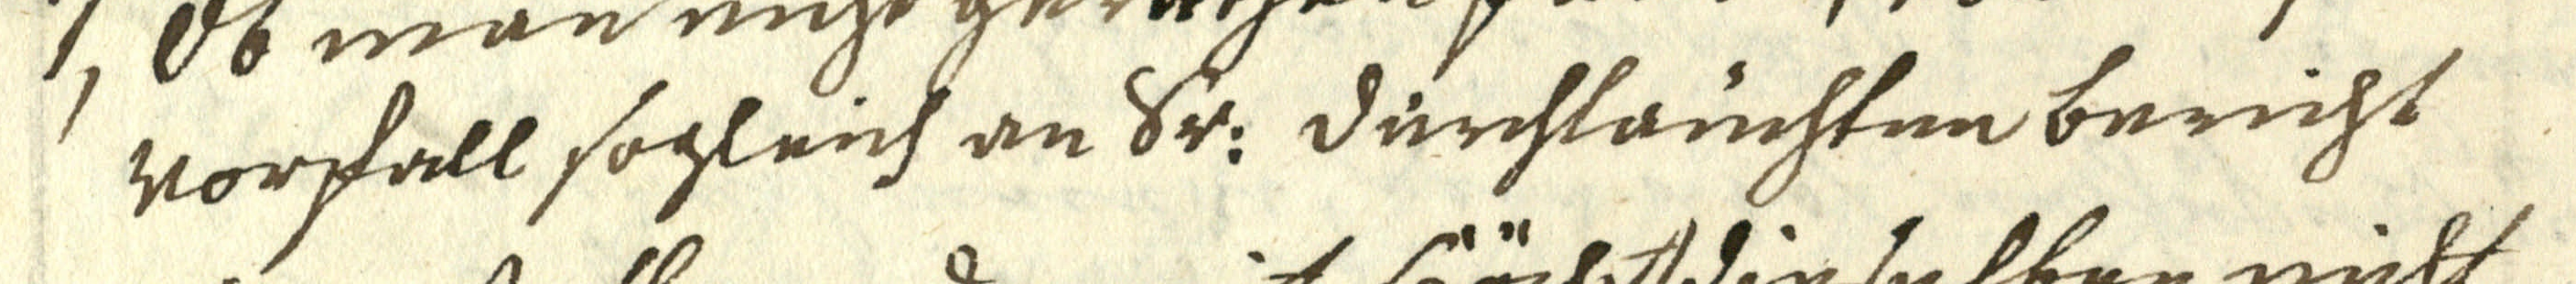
Vorfall sogleich an Sr Durchlauchten Bericht
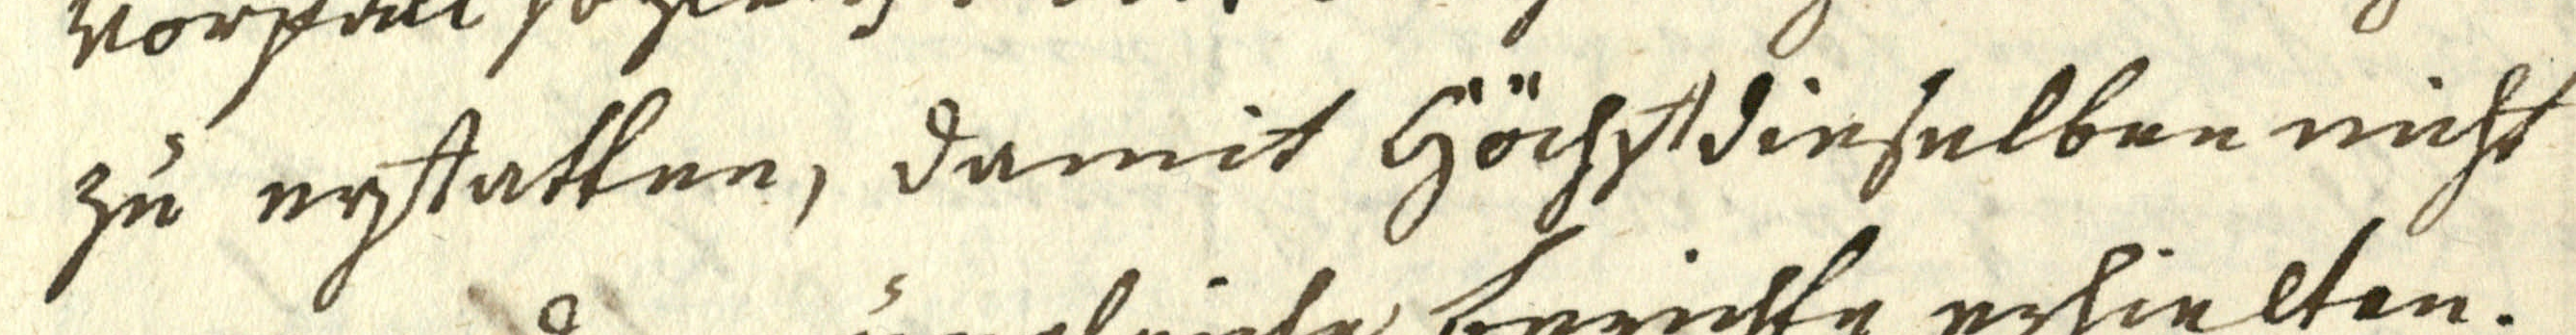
zu erstatten, damit Hochdieselben nicht
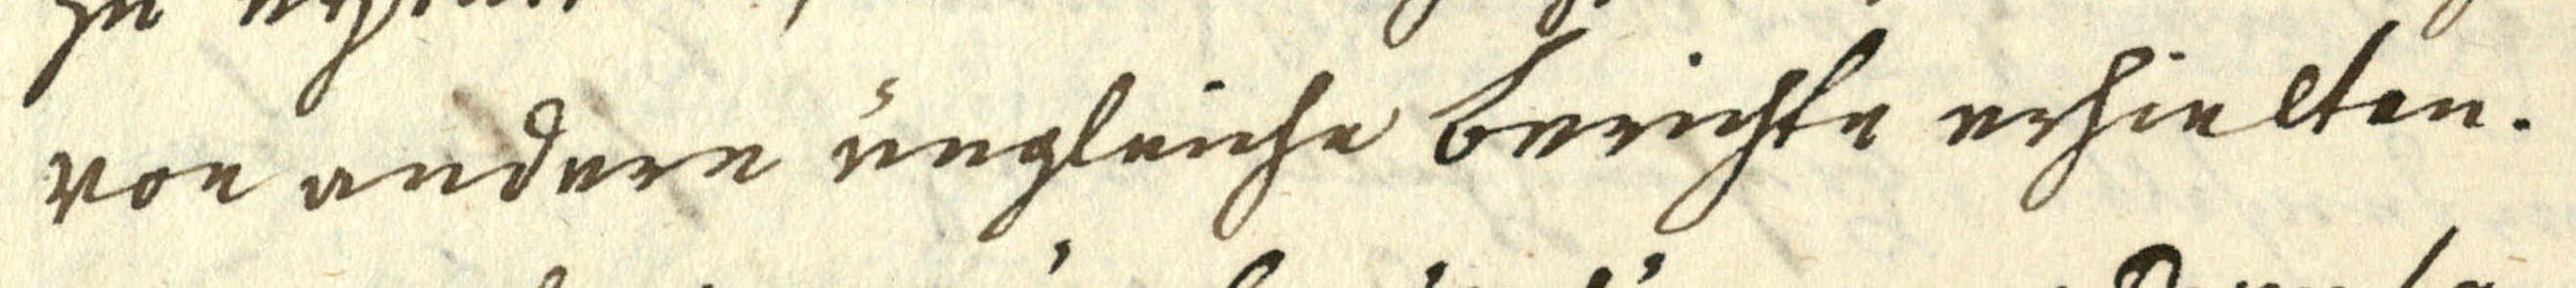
von andern ungleiche Berichte erhielten.
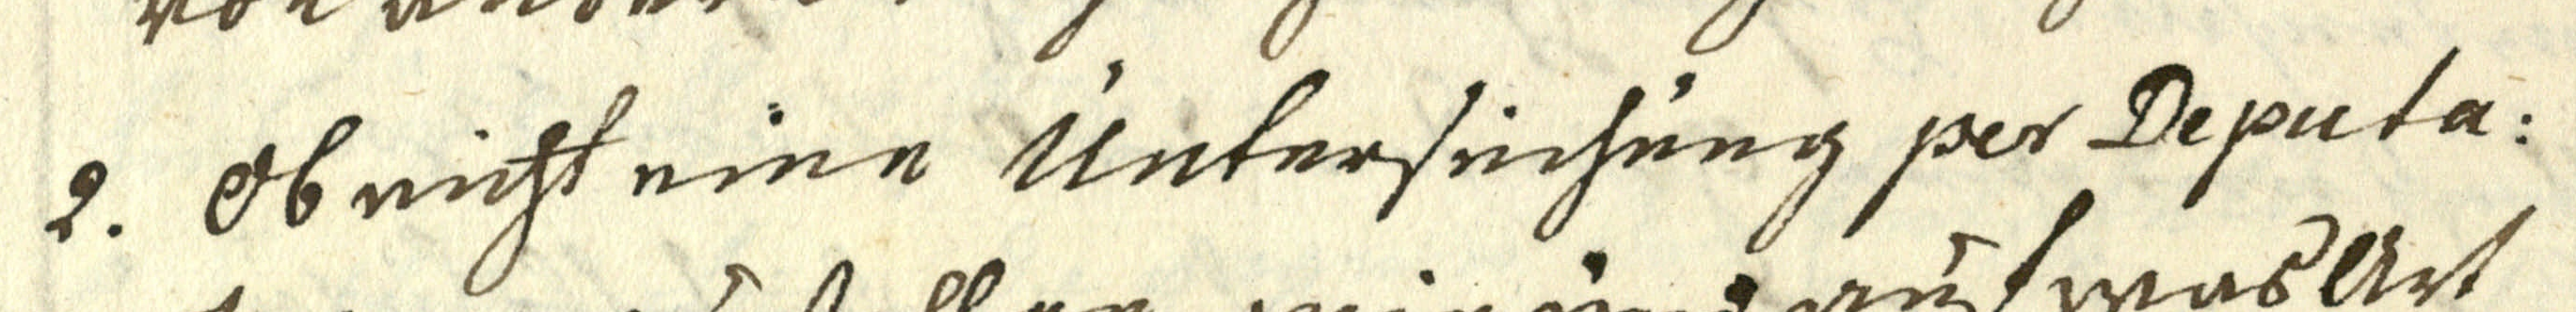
2. Ob nicht eine Untersuchung per Deputa¬
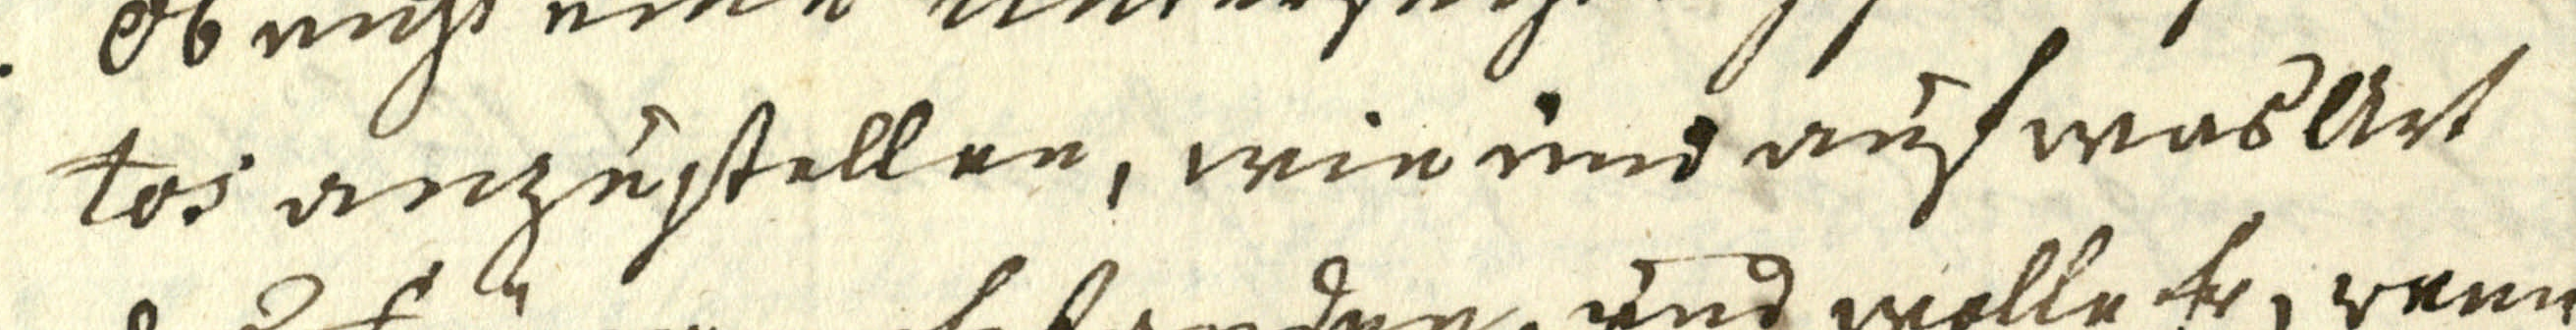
tos anzustellen, wie und auf was Art
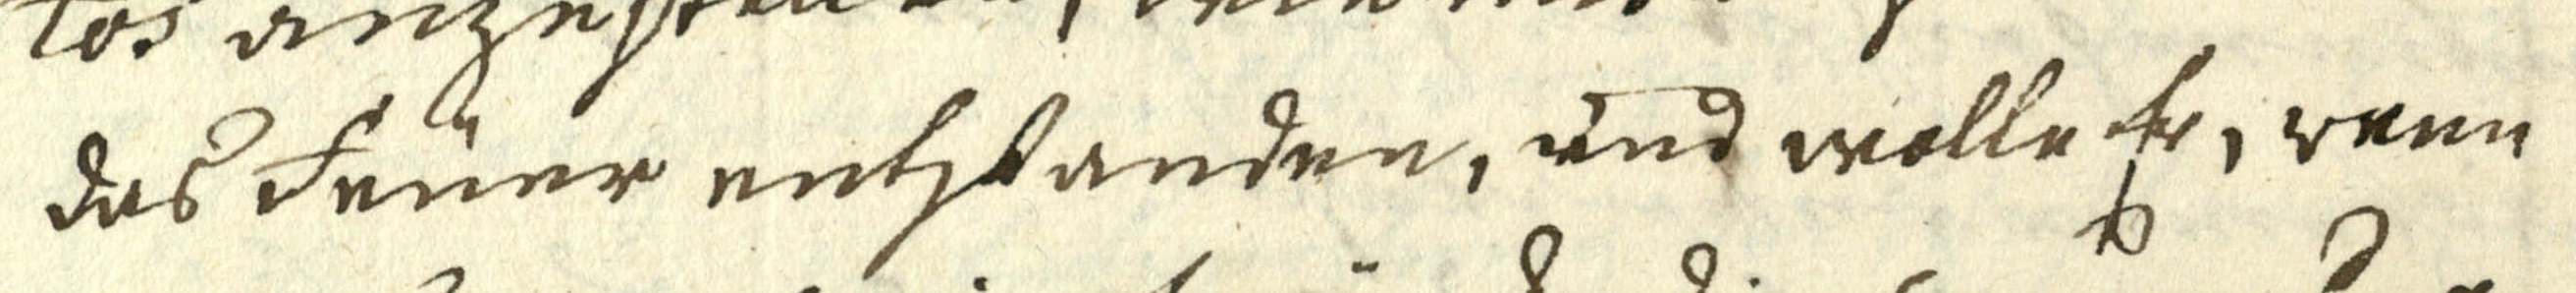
das Feuer entstanden, und wolle Er, wenn
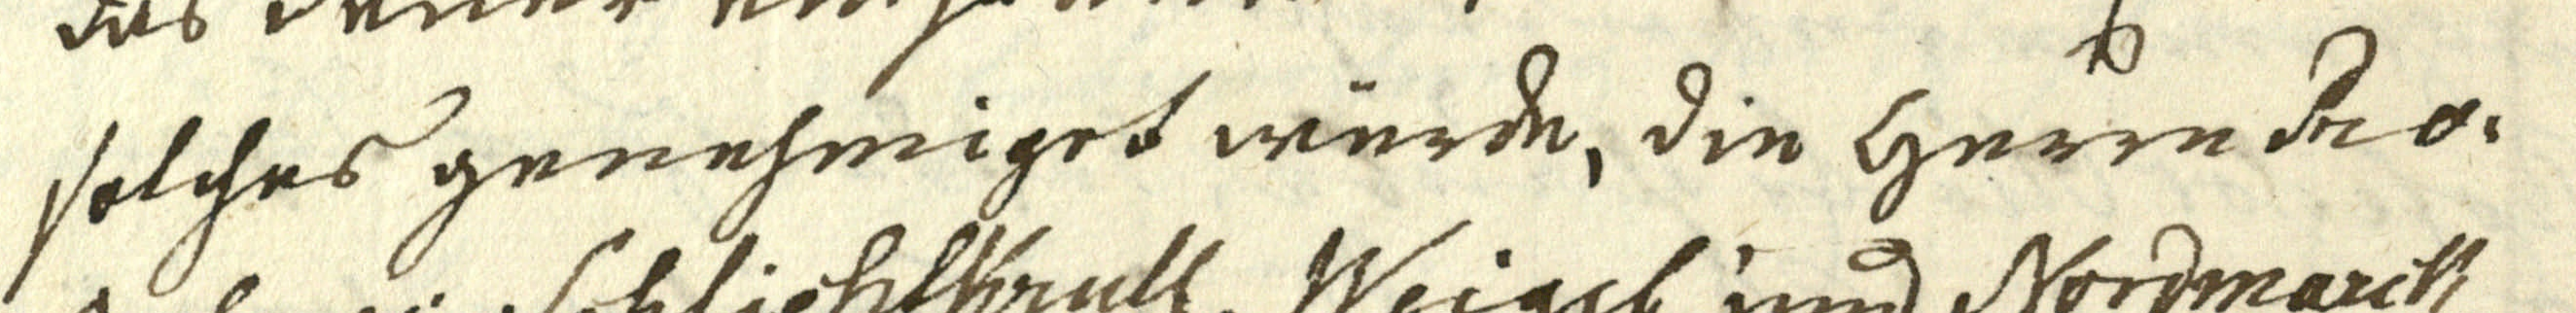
solches genehmiget würde, die Herrn Pro¬
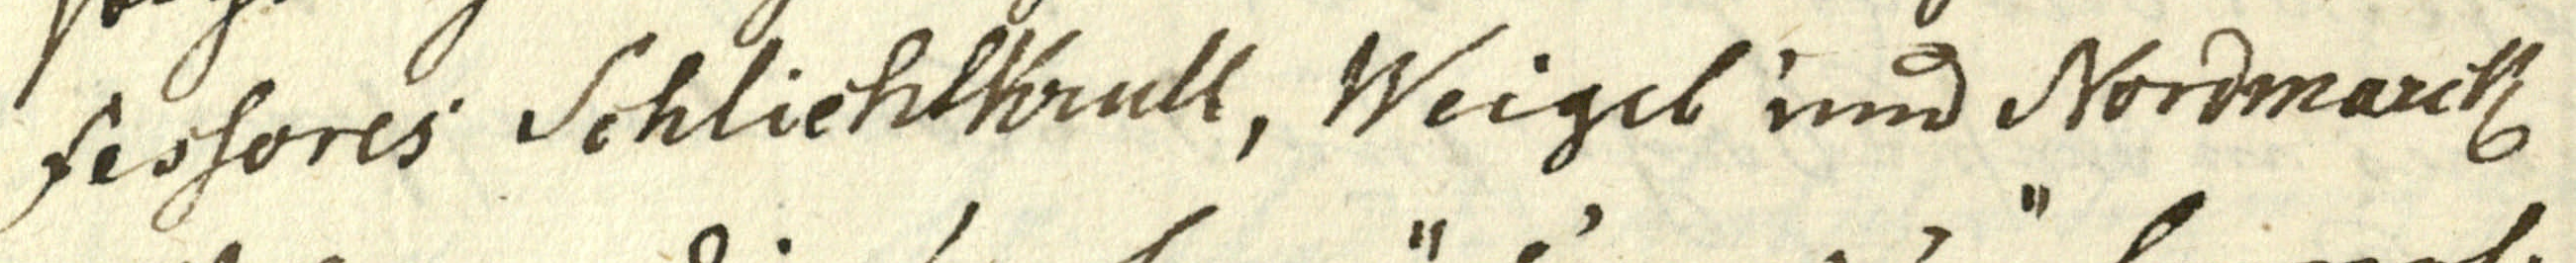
fessores Schlichtkrull, Weigel und Nordmarck
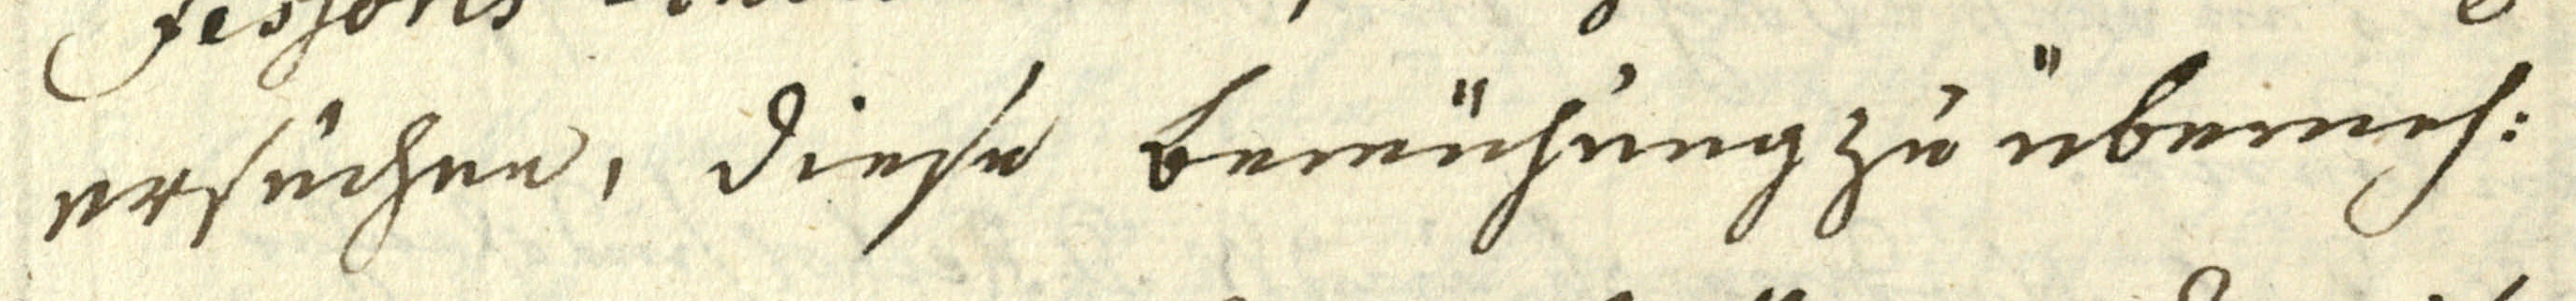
ersuchen, diese Bemühung zu überneh¬
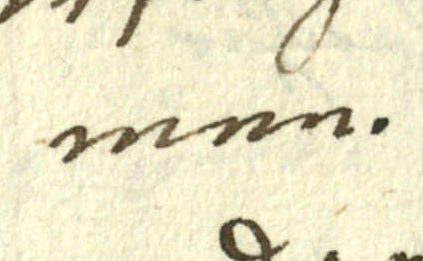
men.
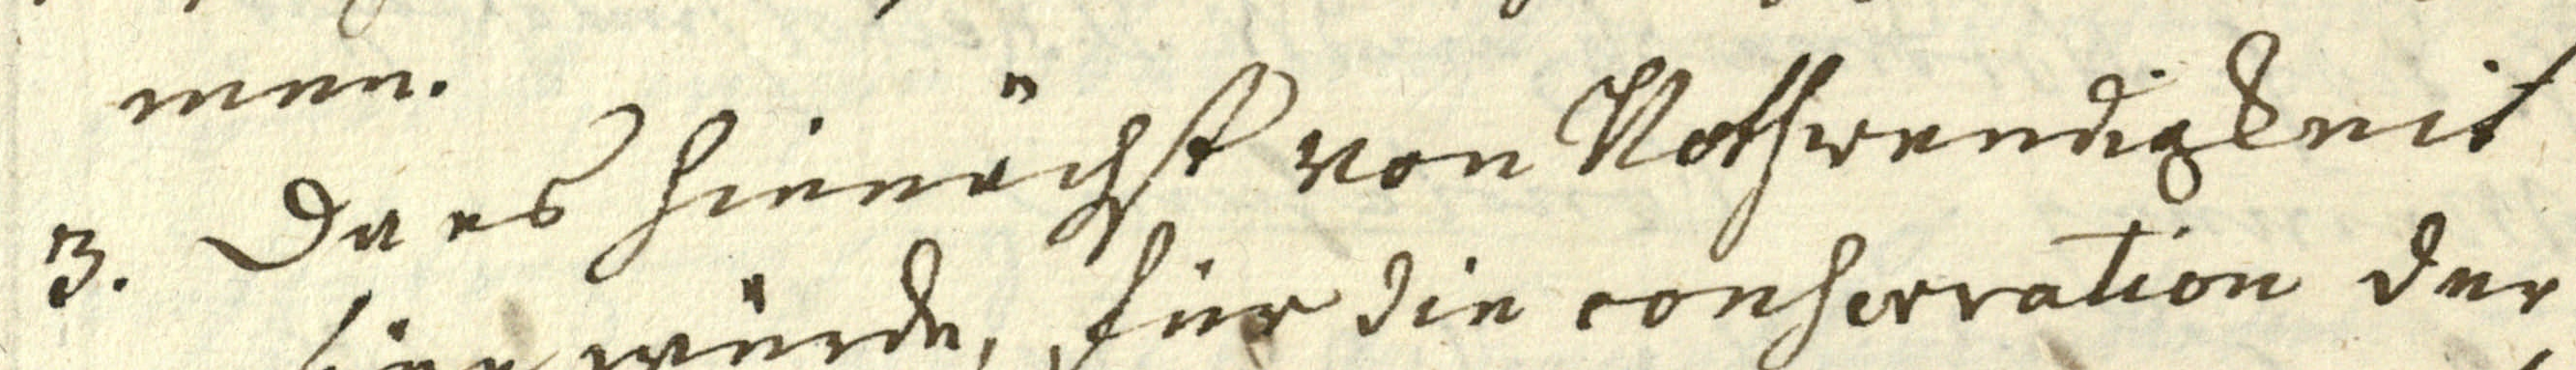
3. Da es hienächst von Nothwendigkeit
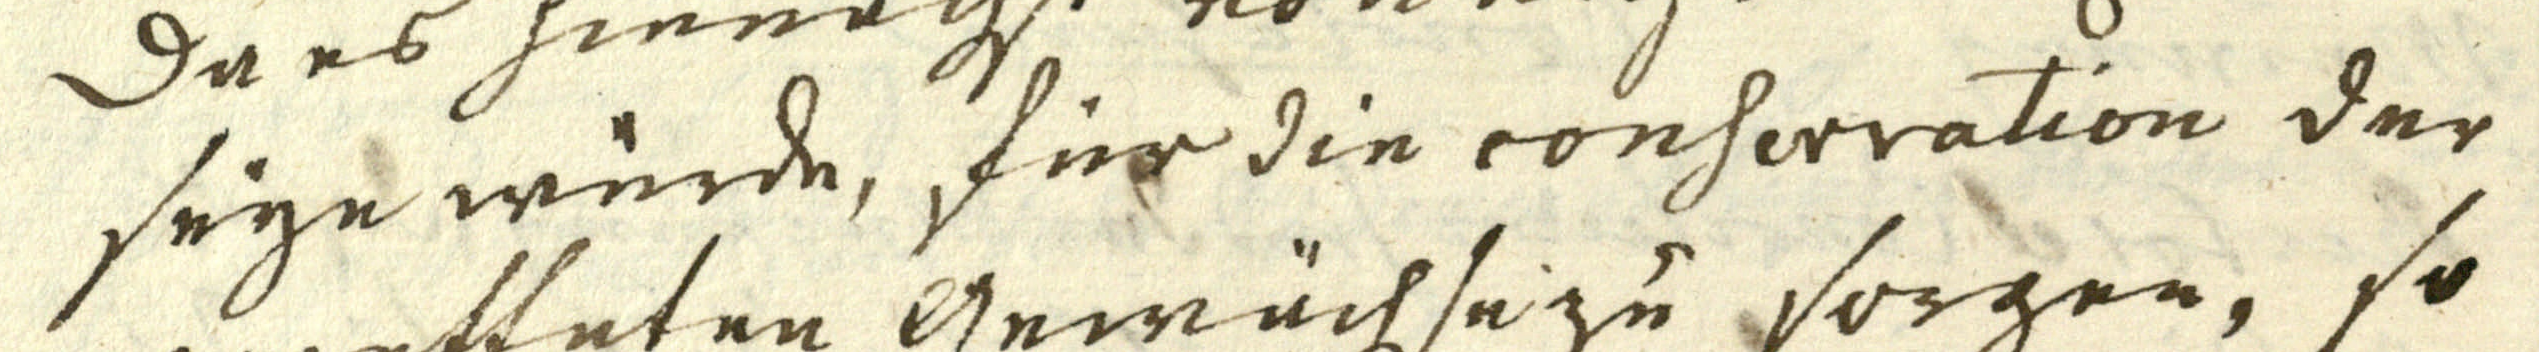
seÿn würde, für die conservation der
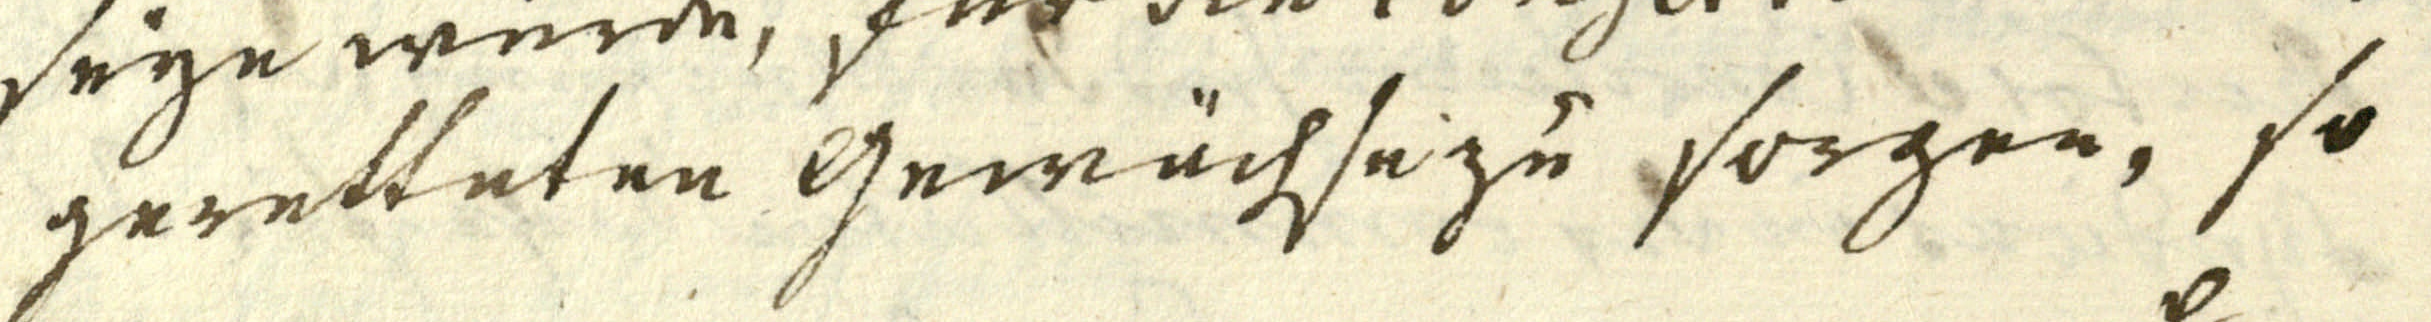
geretteten Gewächse zu sorgen, so
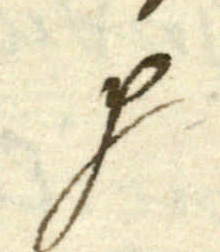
h
